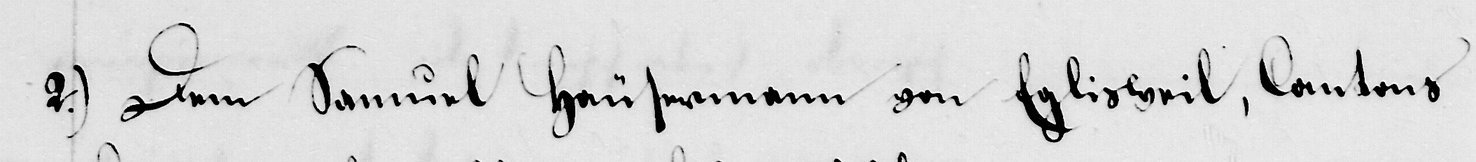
2.) Dem Samuel Häusermann von Eglisweil, Cantons
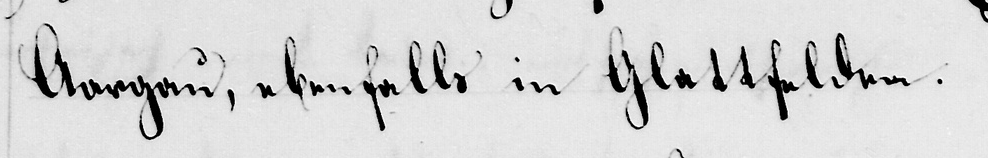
Aargau, ebenfalls in Glattfelden.
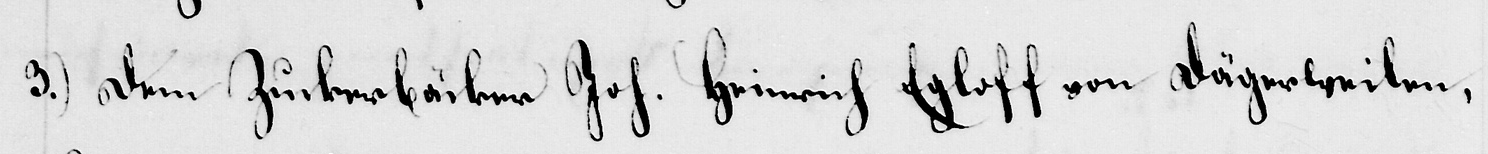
3.) Dem Zuckerbäcker Joh. Heinrich Egloff von Dägerweilen,
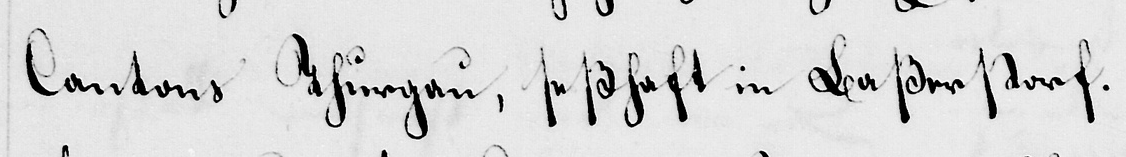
Cantons Thurgau, seßhaft in Baßersdorf.
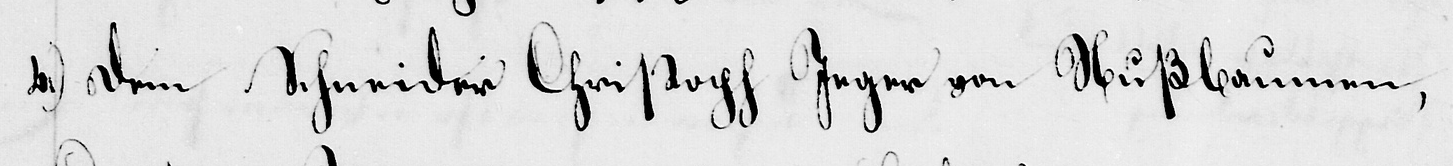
4.) Dem Schneider Christoph Jeger von Nußbaumen,
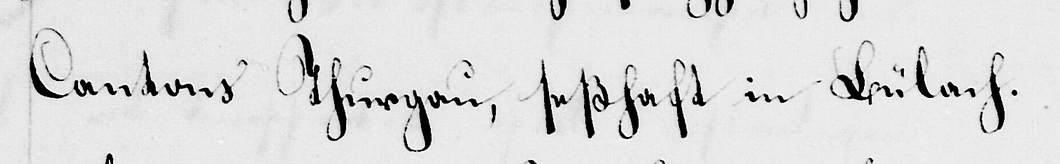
Cantons Thurgau, seßhaft in Bülach.
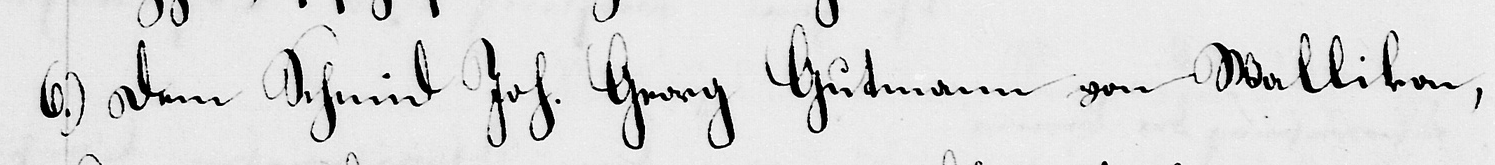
6.) Dem Schmid Joh. Georg Gutmann von Wallikon,
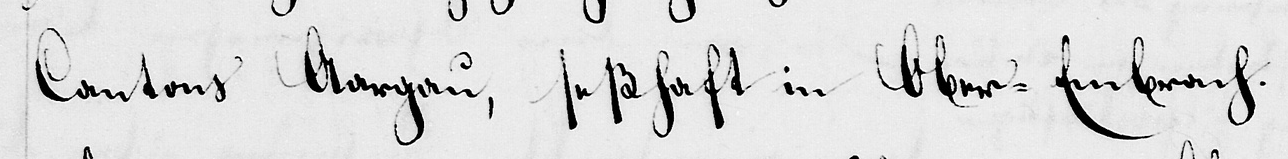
Cantons Aargau, seßhaft in Ober-Embrach.
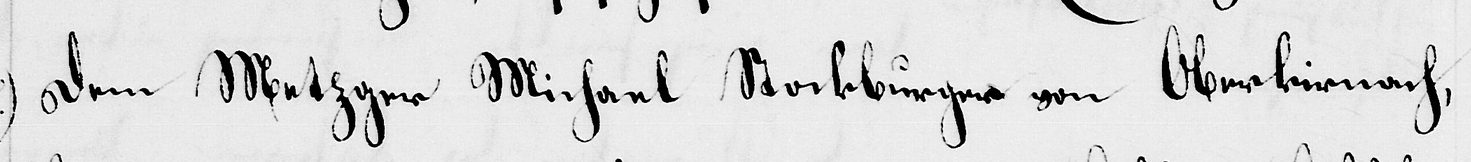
Dem Metzger Michael Stockburger von Oberkirnach,
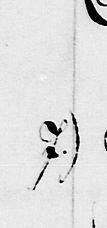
9.)
